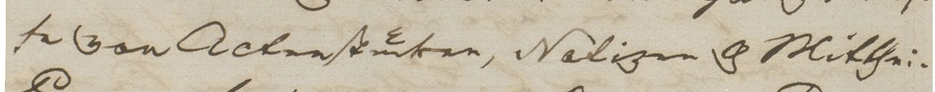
se von Actenstücken, Notizen & Mitthei-
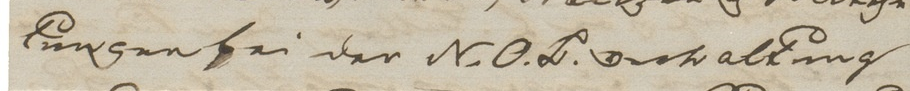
lungen bei der N.O.B. Verwaltung
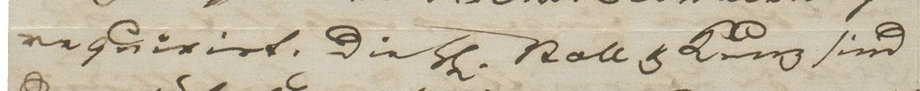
requirirt. Die HH. Stoll & Kunz sind
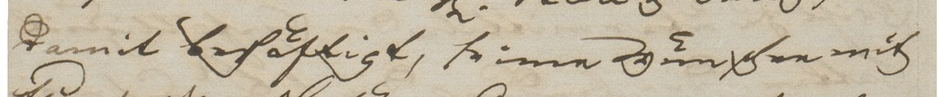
damit beschäftigt, seinen Wünschen mit
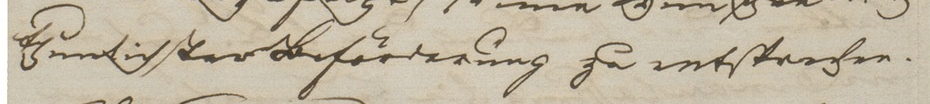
thunlichster Beförderung zu entsprechen.
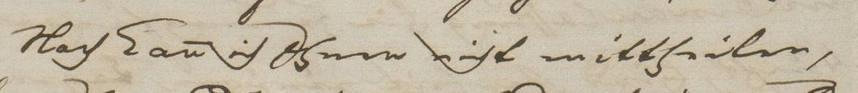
Noch kann ich Ihnen nicht mittheilen,
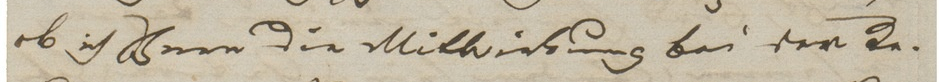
ob ich Ihnen die Mitwirkung bei der Re-
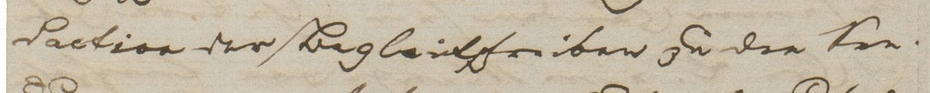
daction der Begleitschreiben zu den Sen-
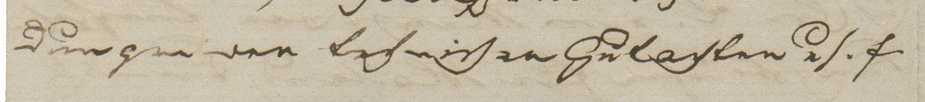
dungen der technischen Gutachten us.
